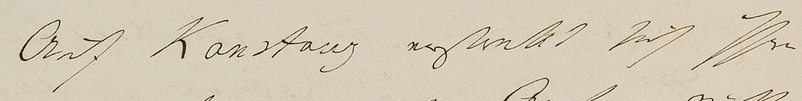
Auf Konstanz erstrekt sich Ihre
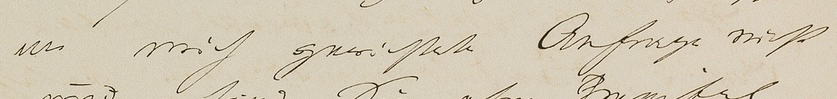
an mich gerichtete Anfrage nicht
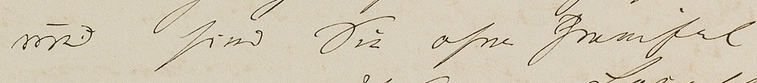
und sind Sie ohne Zweifel
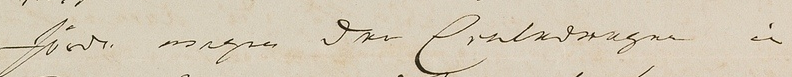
hörde wegen der Einladungen in
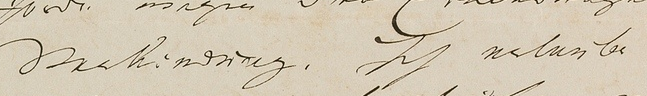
Verbindung. Ich erlaube mir
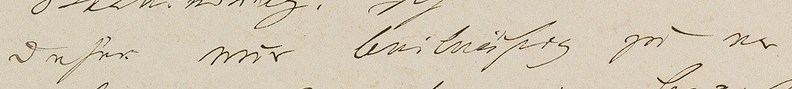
daher nur beiläufig zu er-
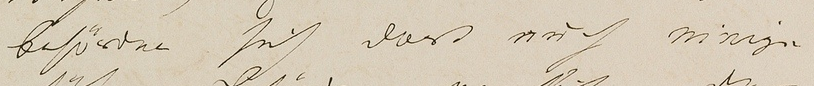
behörden sich daselbst auch einige
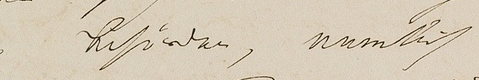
Behörden, nämlich
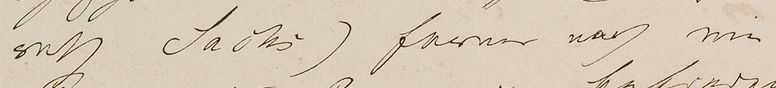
rath Sachs) ferner noch ein
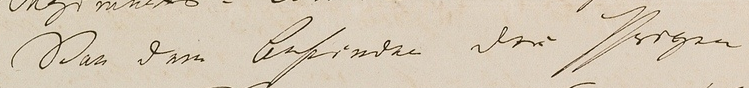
Von dem Befinden der Ihrigen
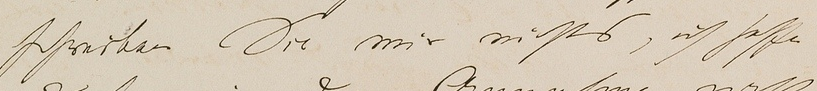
schreiben Sie mir nichts, ich hoffe
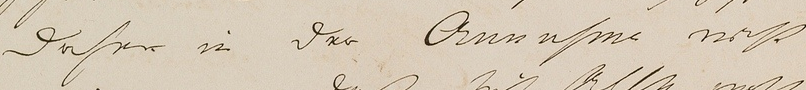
daher in der Annahme nicht
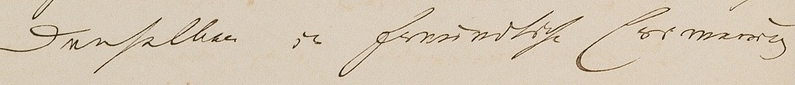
denselben in freundliche Erinnerung
